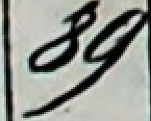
89
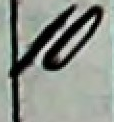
10
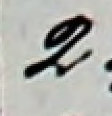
2
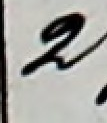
2
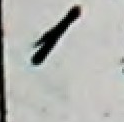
1
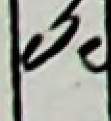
5
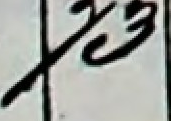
73
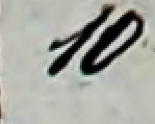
10
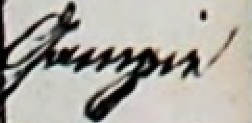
Gamzie
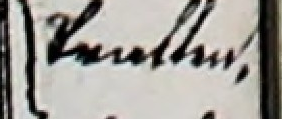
Tratten„
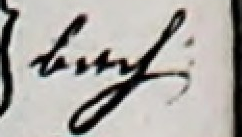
bach
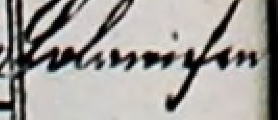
Fol???fen
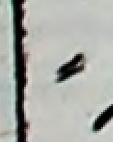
„
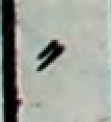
„
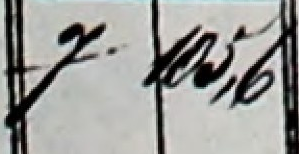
7 105,6
